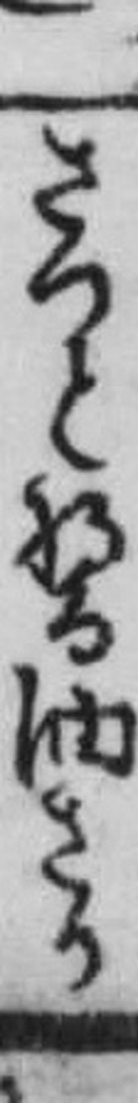さつと醤油さか
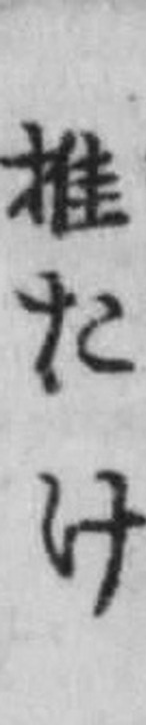椎たけ
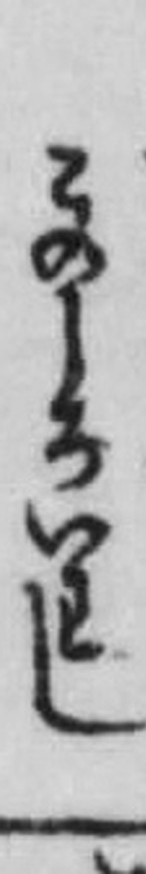このしろいわし
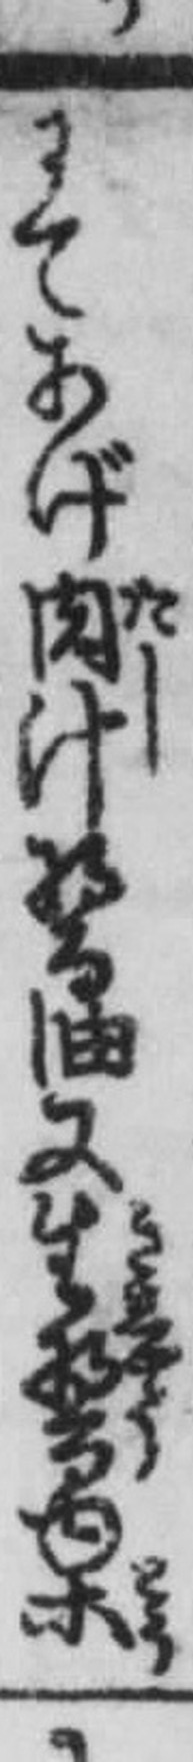にてあげ肉汁醤油又生醤油等
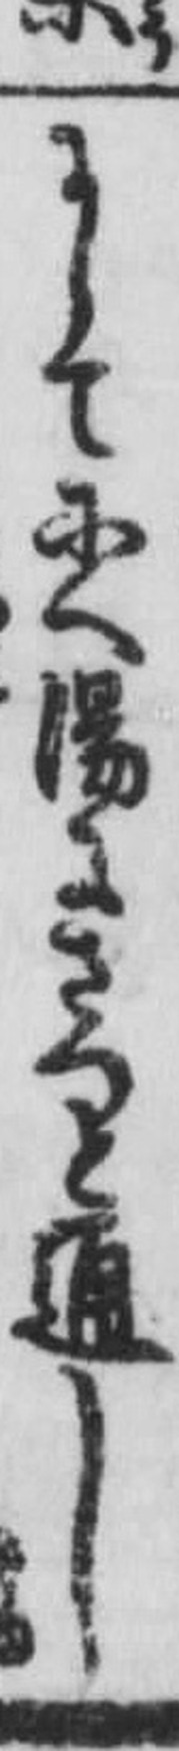にしてにへ湯にさつと通し
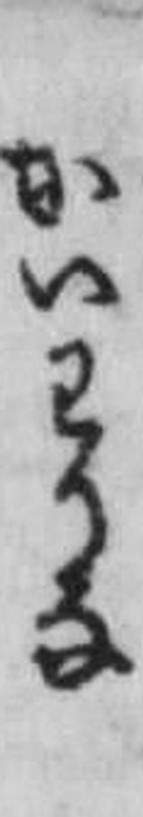かいわりな
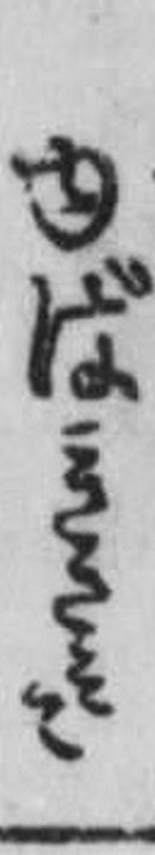ゆばきさみて
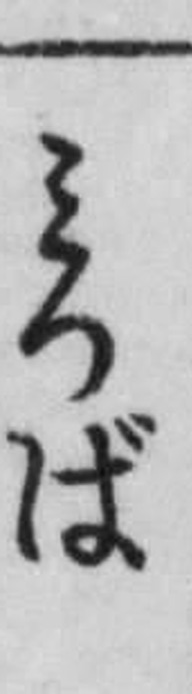みつば
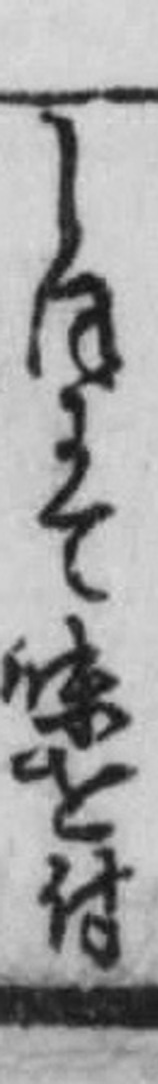しほにて味を付
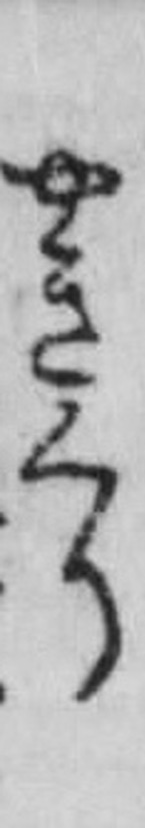やきくり
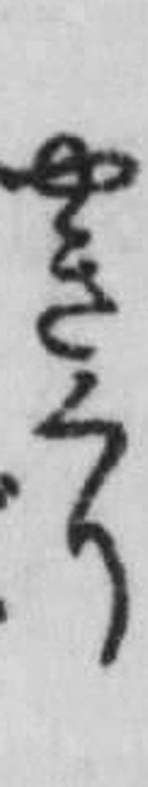やきくり
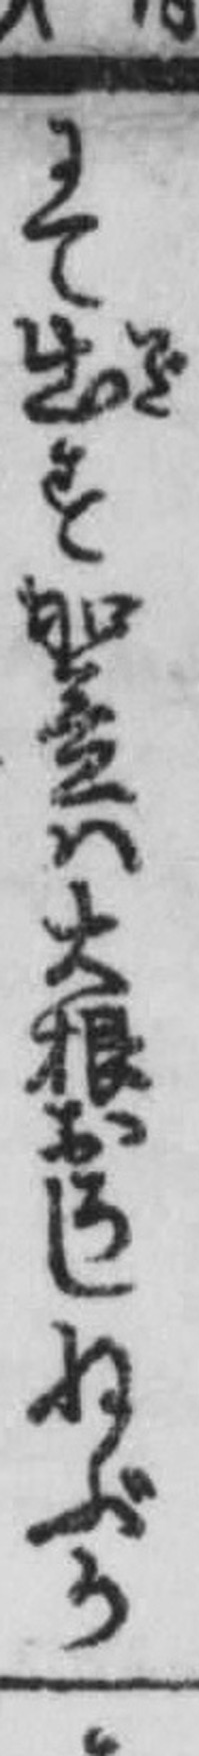にて出す加益は大根おろしねぶか
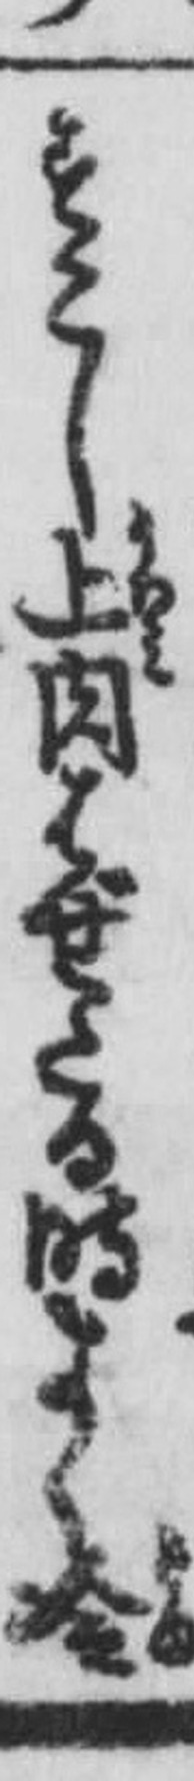すこし上肉はぜたる時よく冷
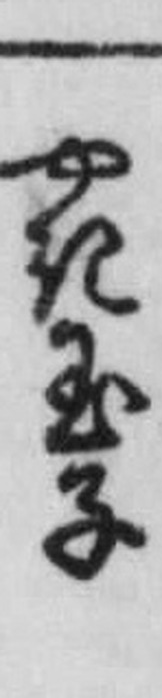やき玉子
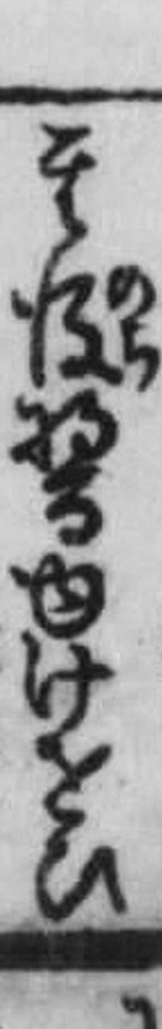其後醤ゆけを
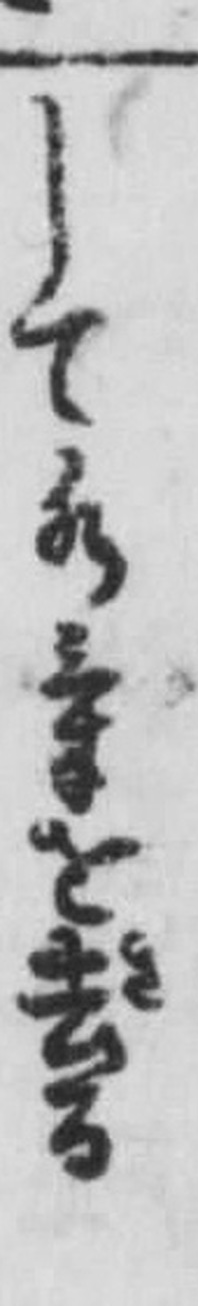して水気を去る
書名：精進魚類間合料理/早速庖丁
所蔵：大阪府立大学学術情報センター 国文学研究資料館
